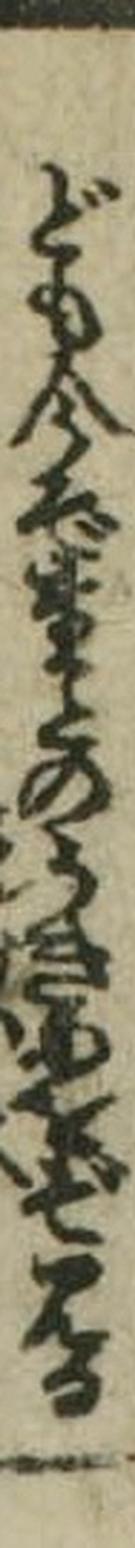ども今ぞまことのうきめをぞ見る
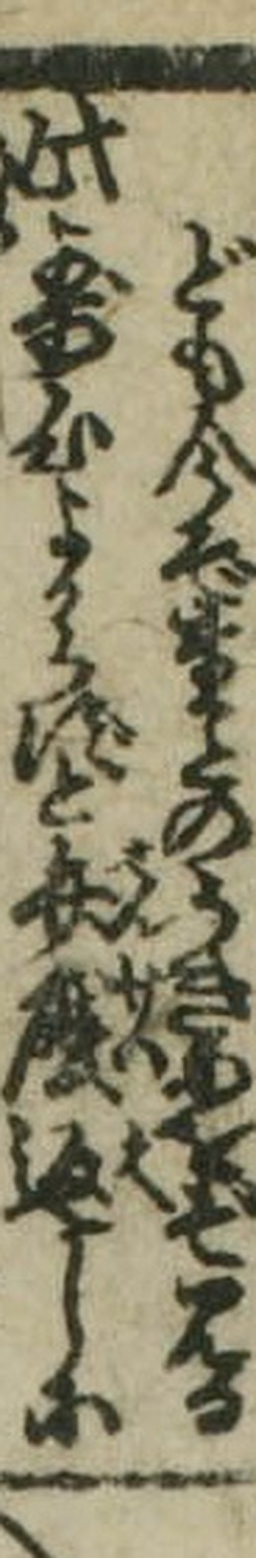此歌心よからずと弁慶返しに
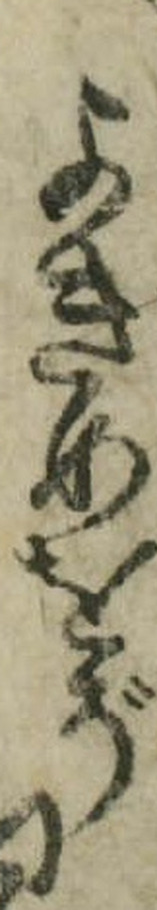よきめをぞ
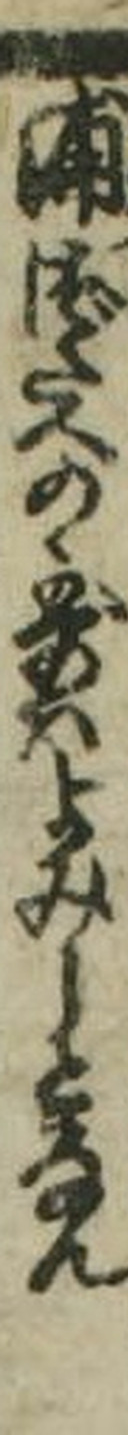浦づたへの歌はよみしとなん
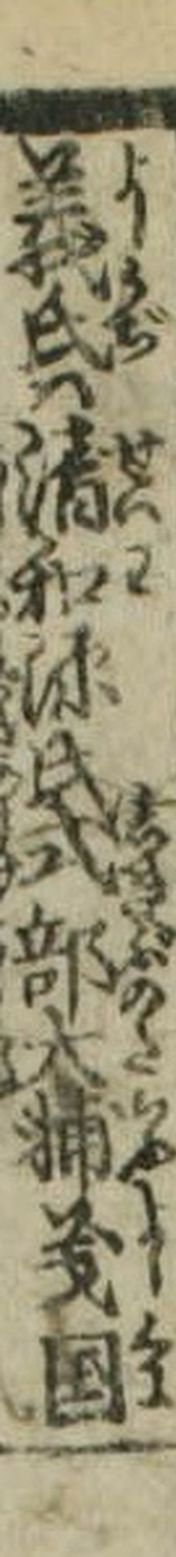義氏は清和源氏式部大輔義国
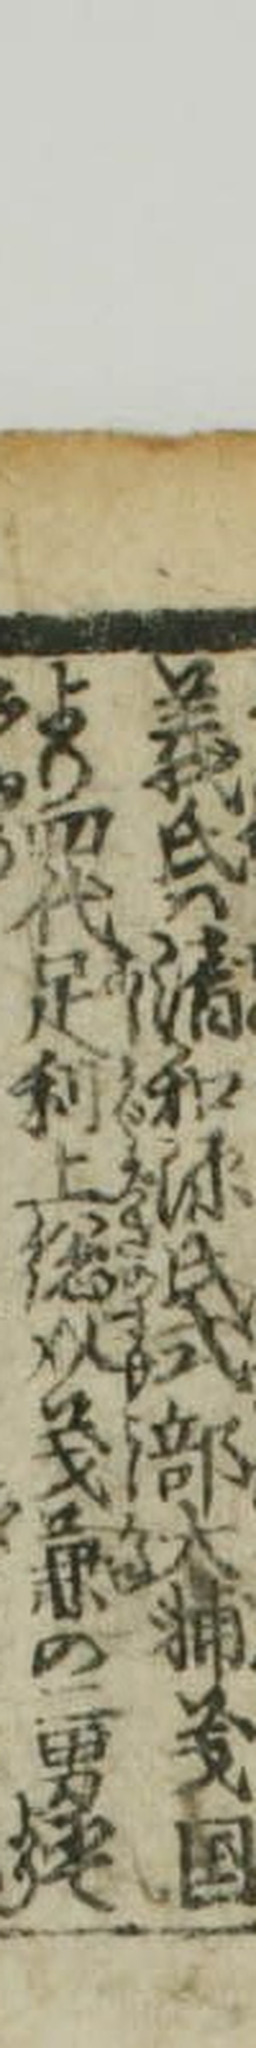より四代足利上総介義兼の二男にて
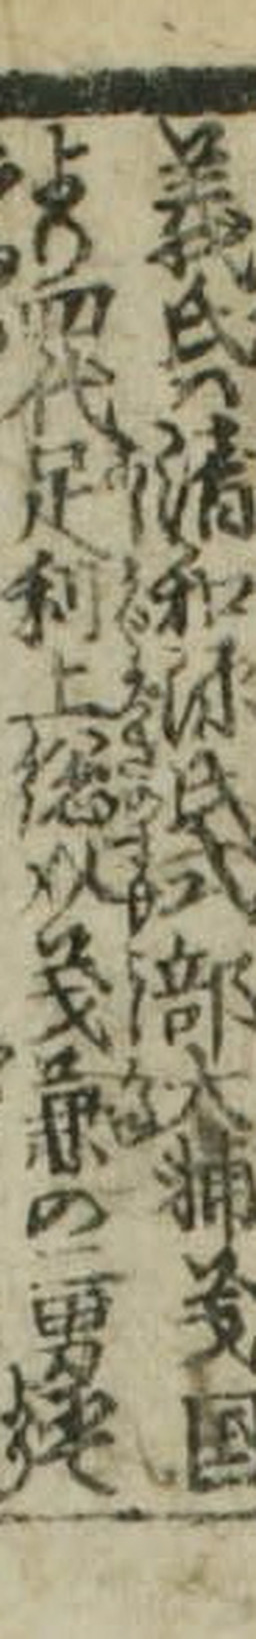より四代足利上総介義兼の二男にて
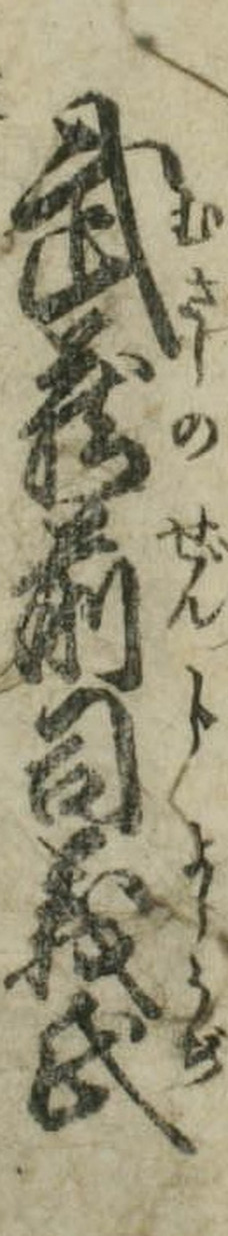武蔵前司義氏
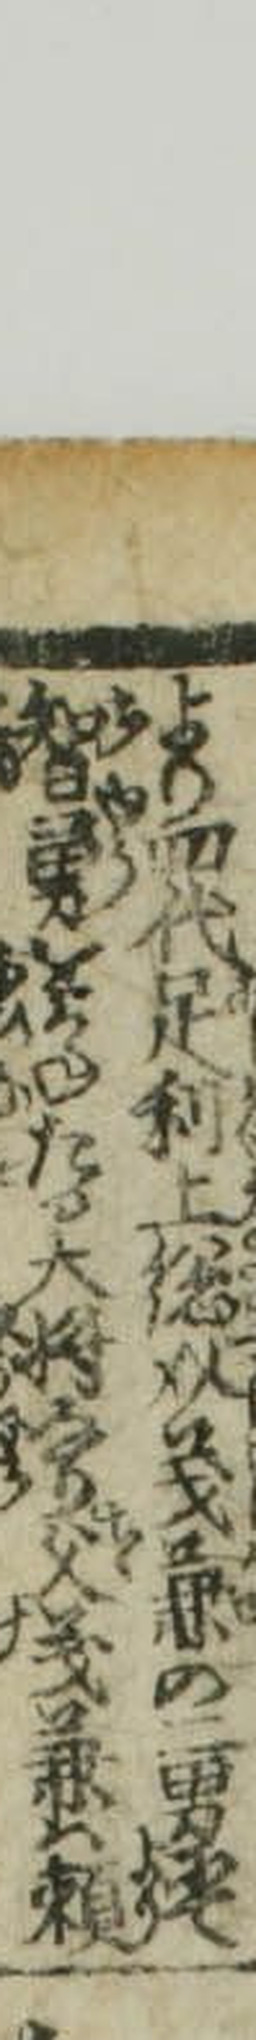智勇をかねたる大将なり父義兼は頼
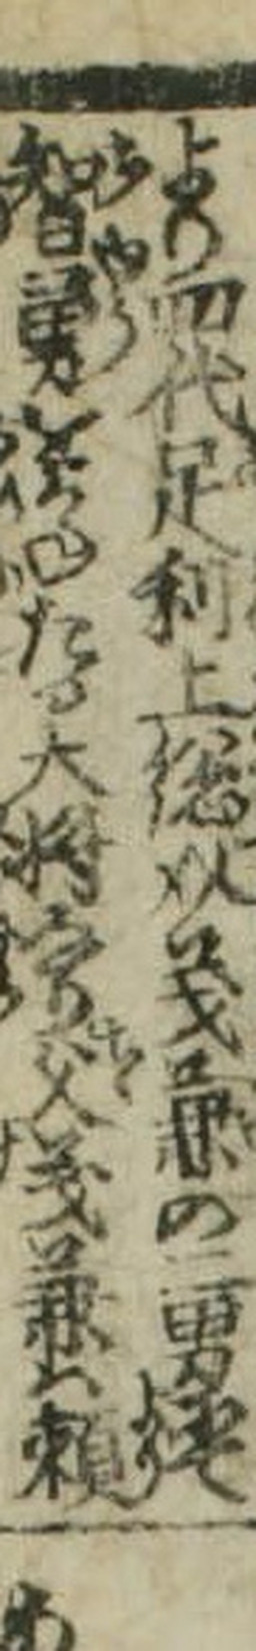智勇をかねたる大将なり父義兼は頼
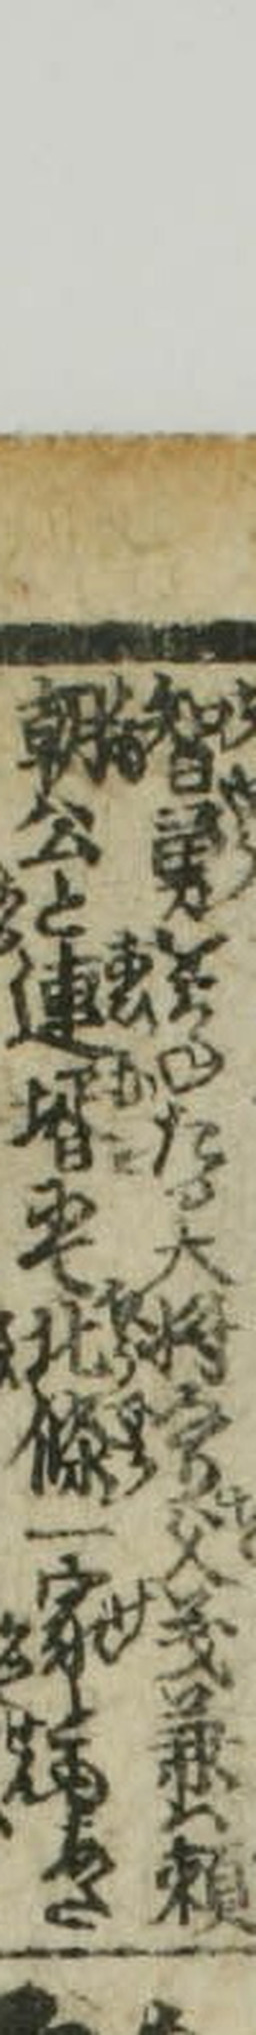朝公と連壻にて北条一家ともあた
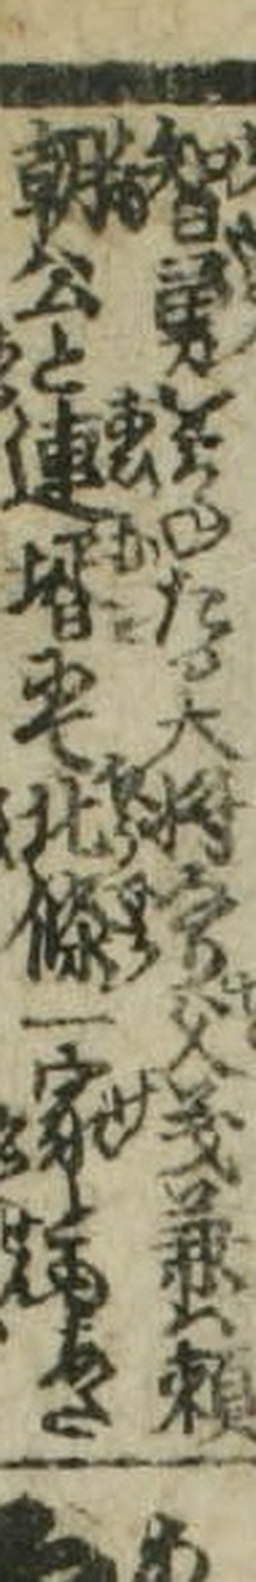朝公と連壻にて北条一家ともあた
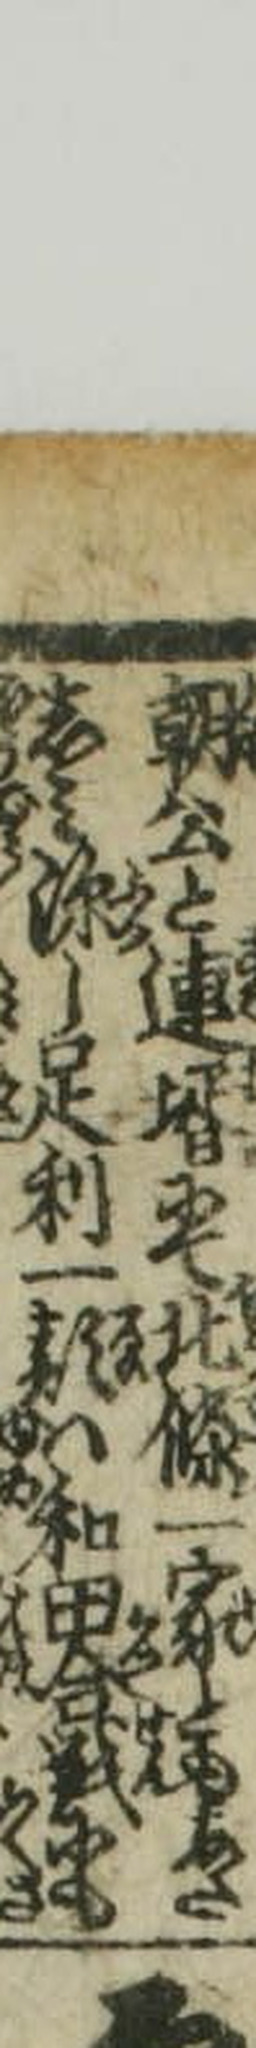しみ深し足利一類は和田合戦にも
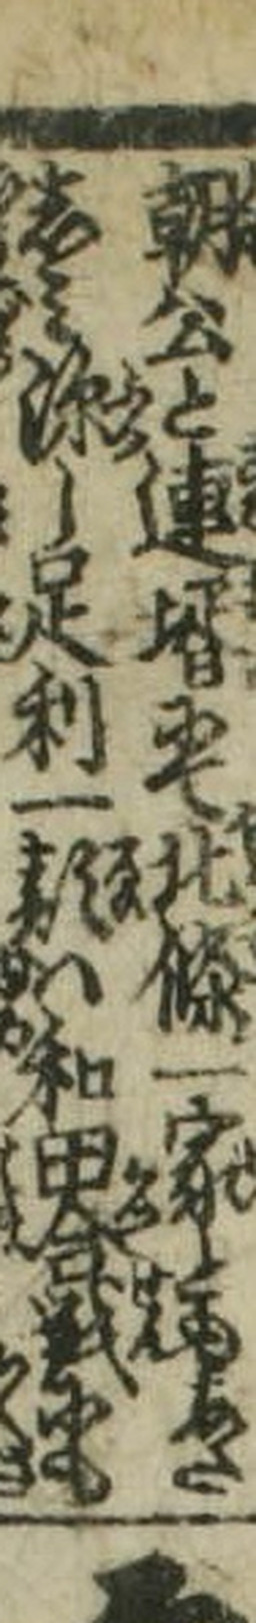しみ深し足利一類は和田合戦にも
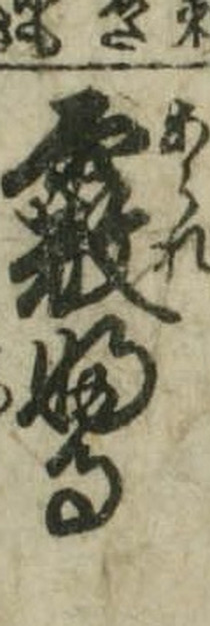霰ふる
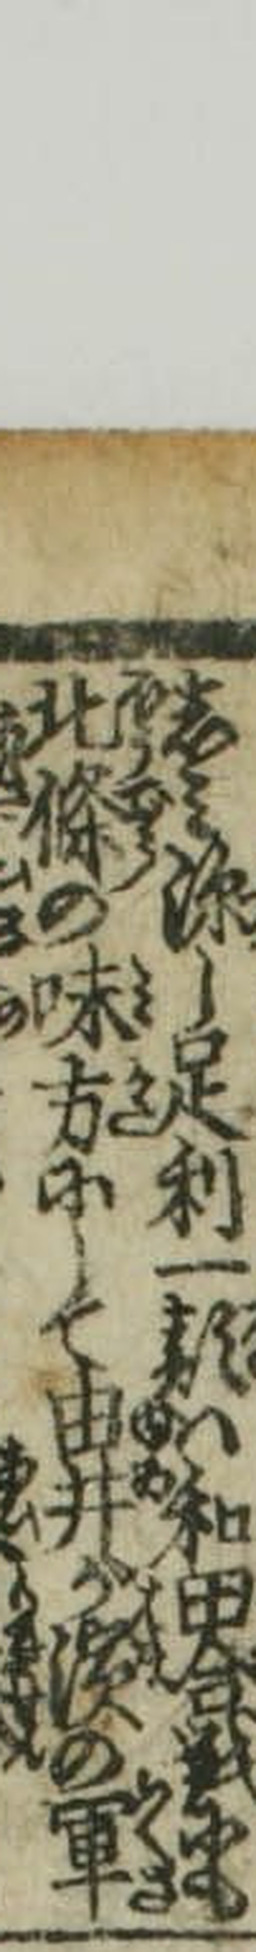北条の味方にして由井が浜の軍
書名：續英雄百人一首
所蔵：東京学芸大学附属図書館
